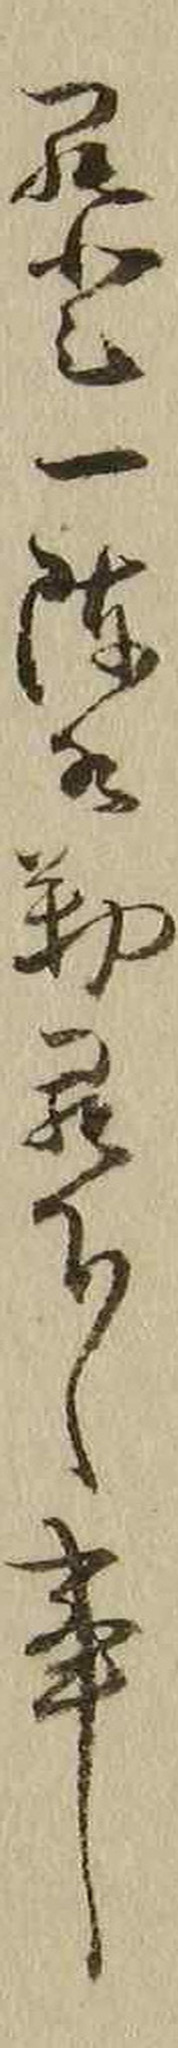罷登一陣相勤罷下候事
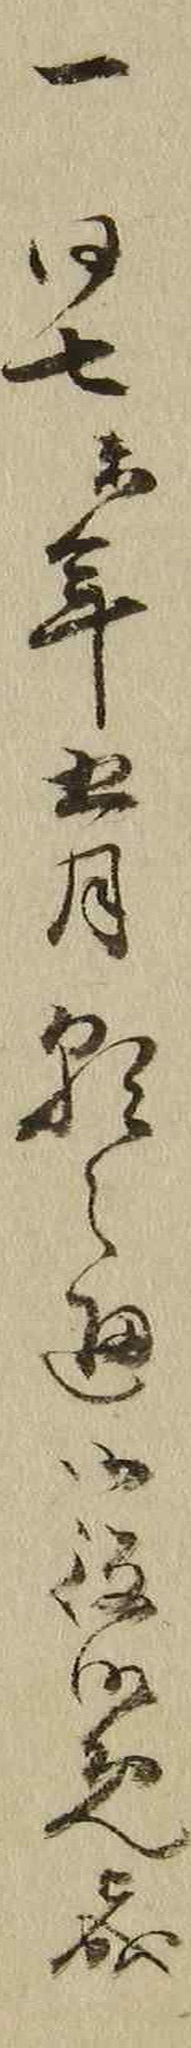一同七未年五月願之通御役御免被成
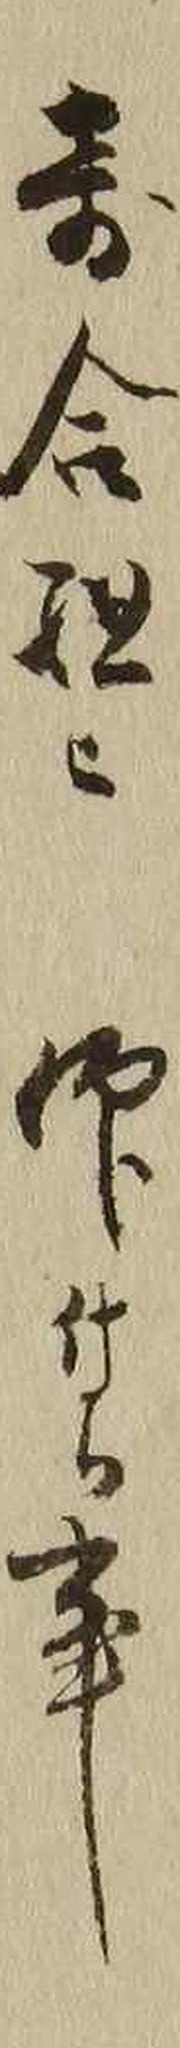寄合組被仰付候事
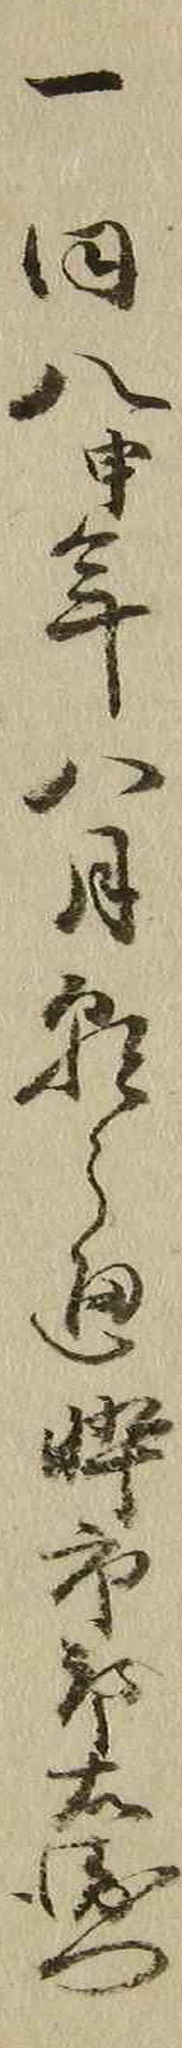一同八申年八月願之通忰市郎右衛門
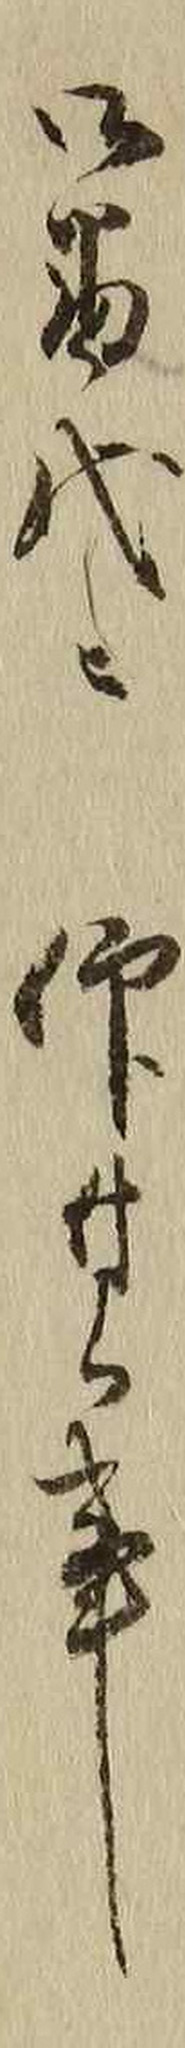御番代被仰付候事
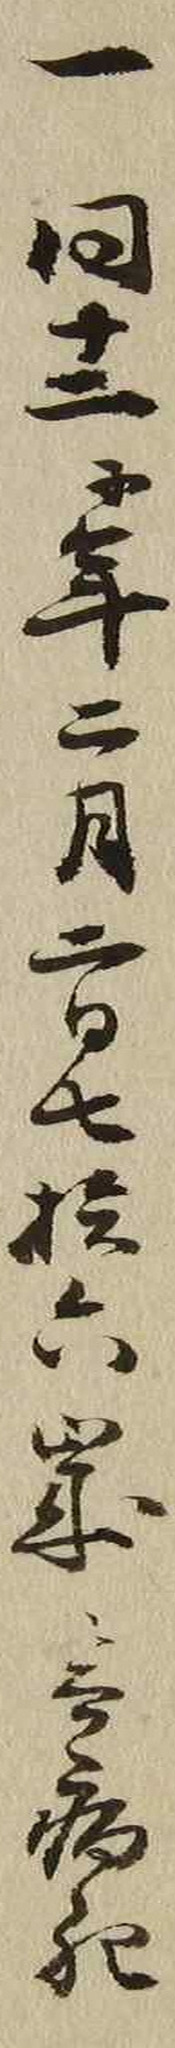一同十二子年二月二日七拾六歳ニ而病死
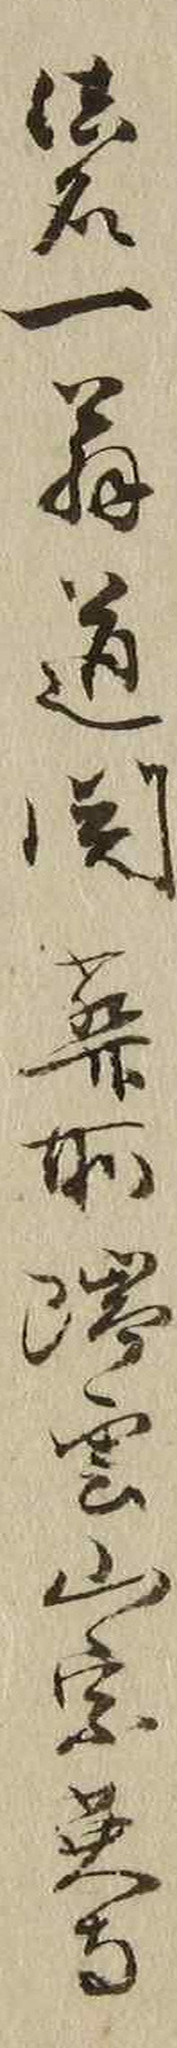法名一翁道関葬所端雲山宗英寺
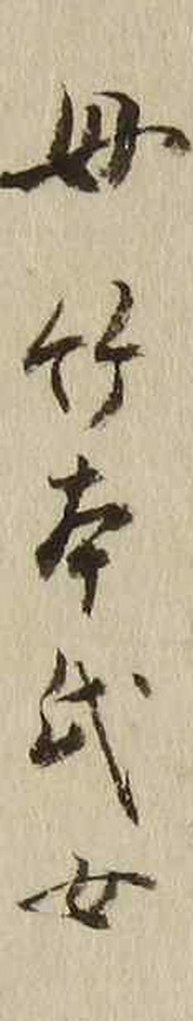母竹本氏女
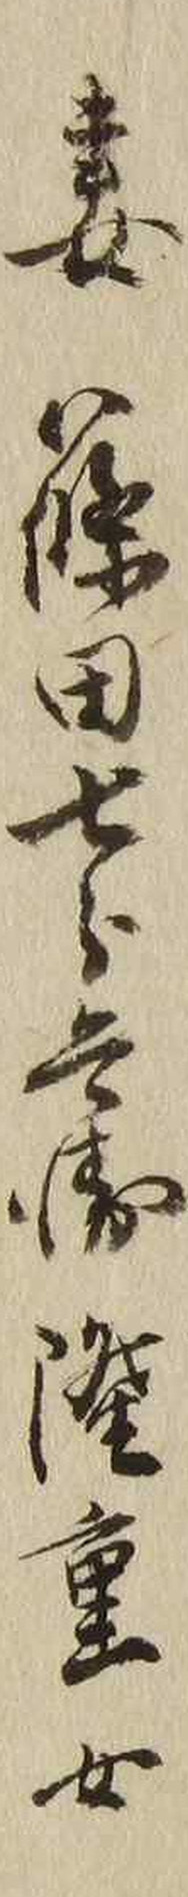妻篠田七郎兵衛隆重女

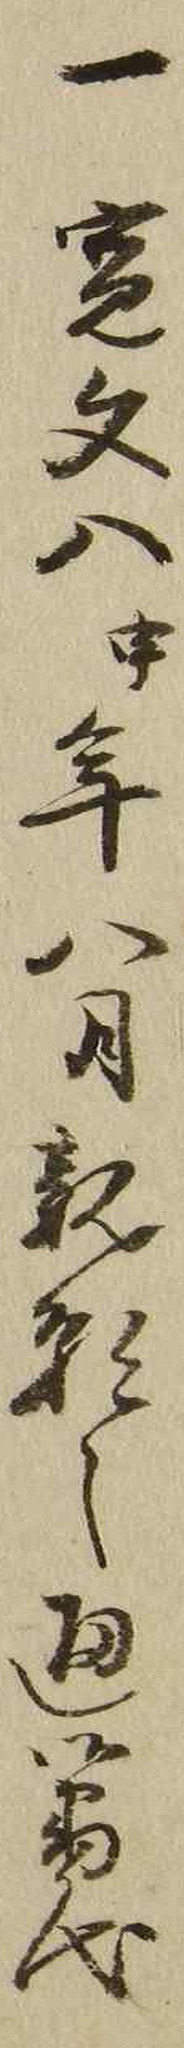一寛文八申年八月親願之通御番代
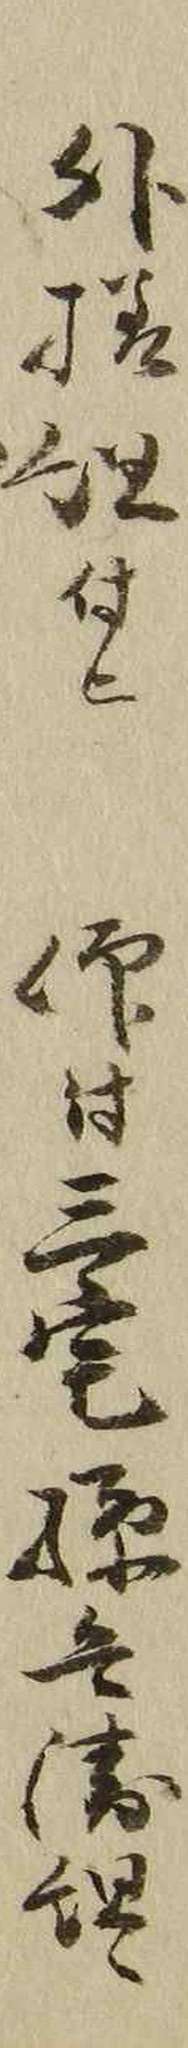外様組付被仰付三宅孫兵衛組へ
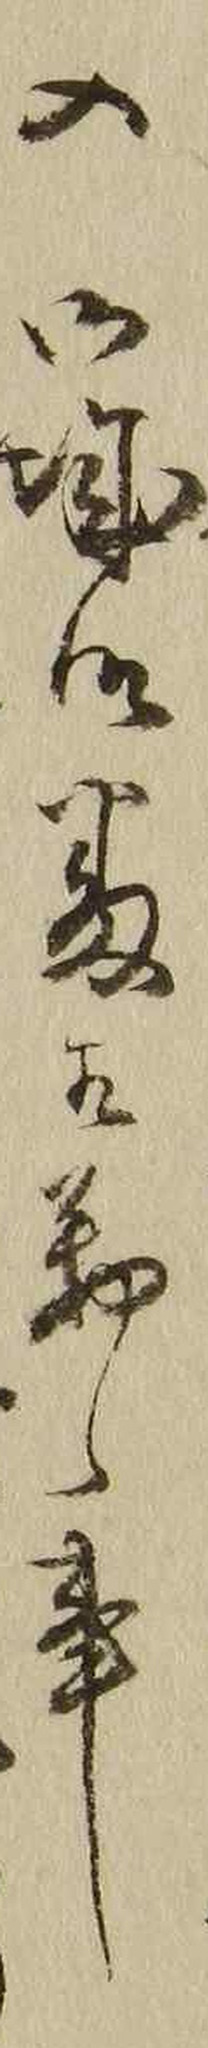入御城御番相勤候事
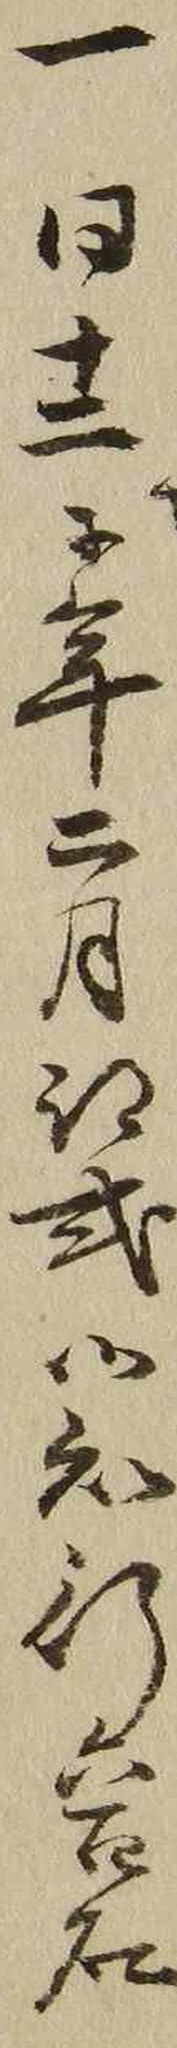一同十二子年二月跡式御知行六百石
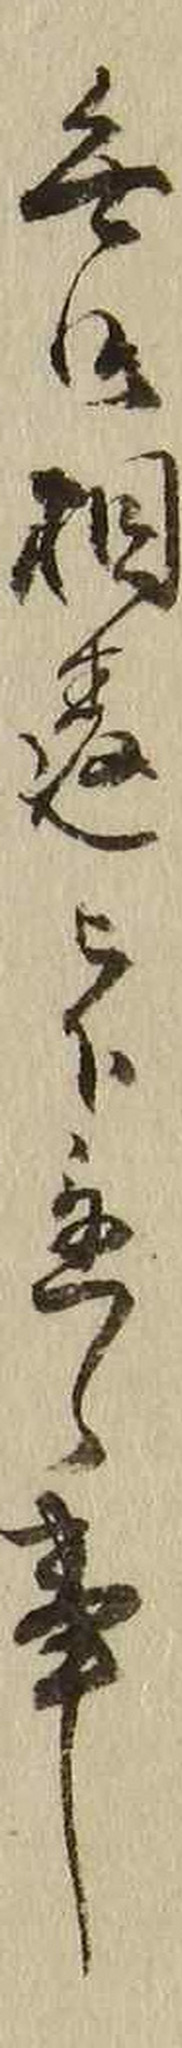無御相違被下置候事
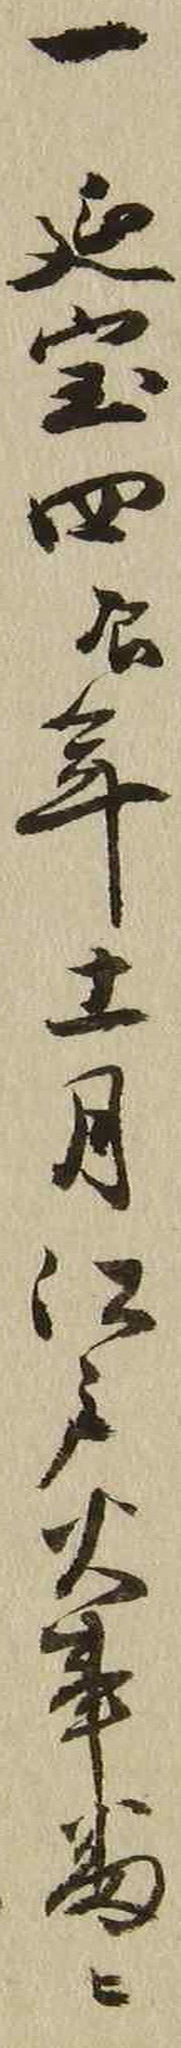一延宝四辰年十一月江戸火事番被
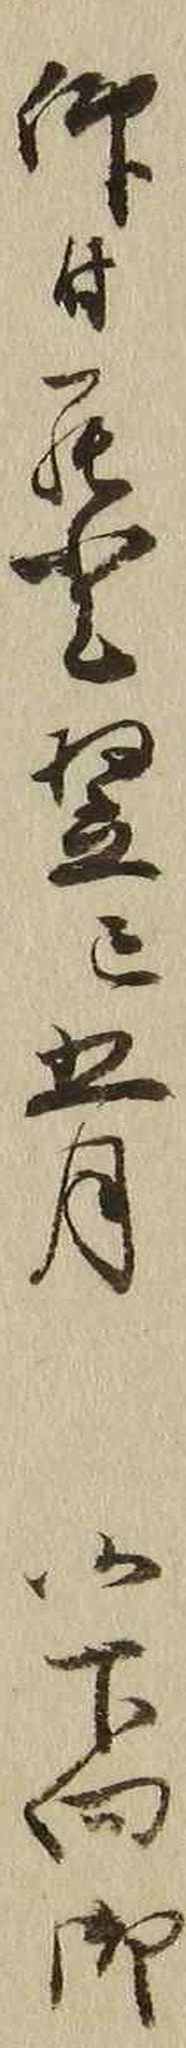仰付罷登翌巳五月御下向御
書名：諸士系譜　巻之232　け之部1
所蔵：会津若松市立会津図書館
